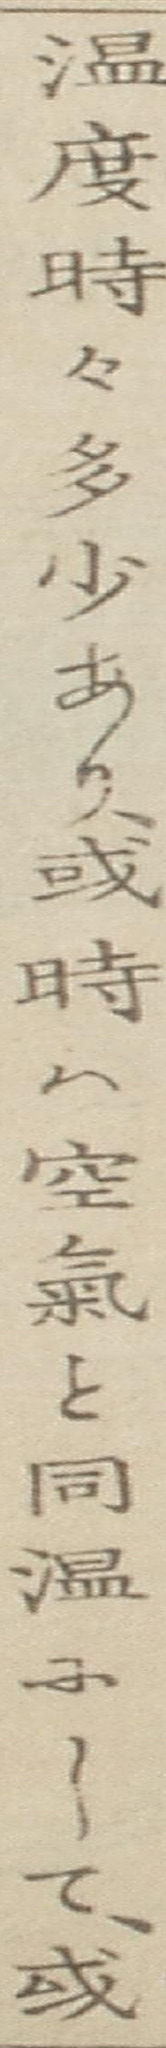温度時々多少あり、或時は空気と同温にして、或
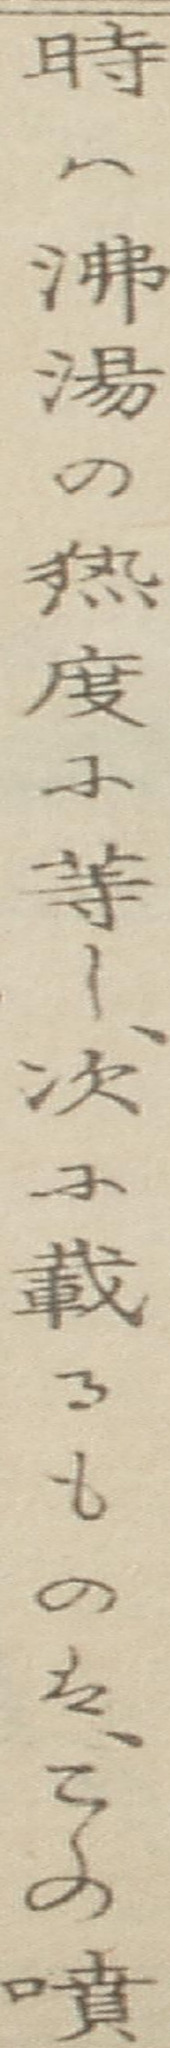時は沸湯の熱度に等し、次に載るものは、この噴
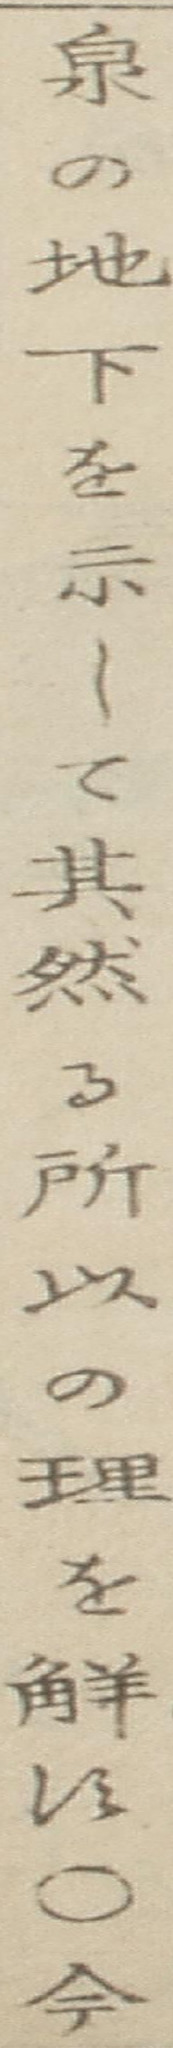泉の地下を示して其然る所以の理を解す〇今
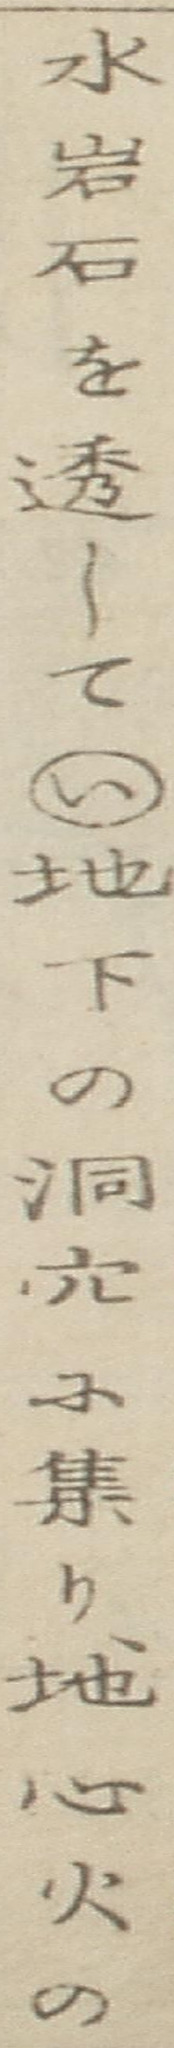水岩石を透してい地下の洞穴に集り、地心火の
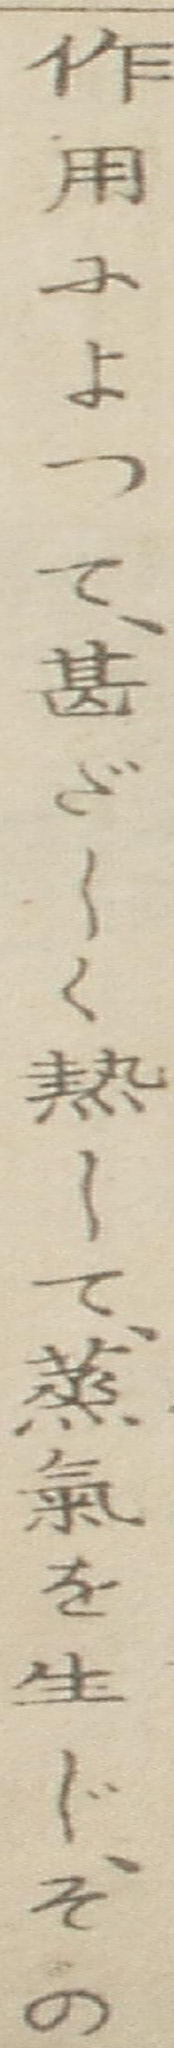作用によつて、甚だしく熱して、蒸気を生じ、その
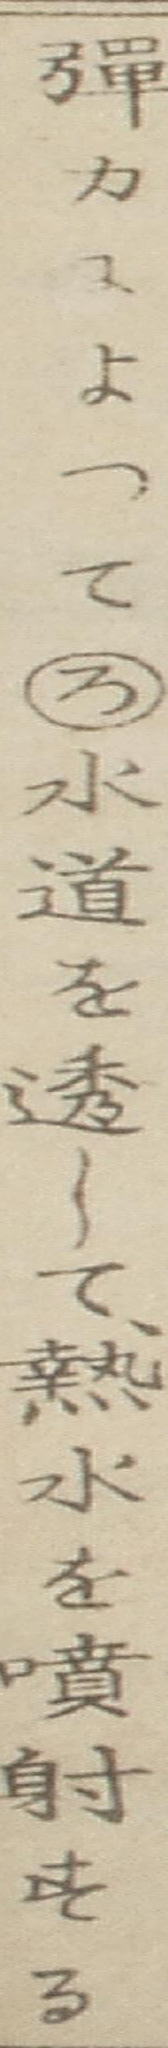弾力によつてろ水道を透して、熱水を噴射する

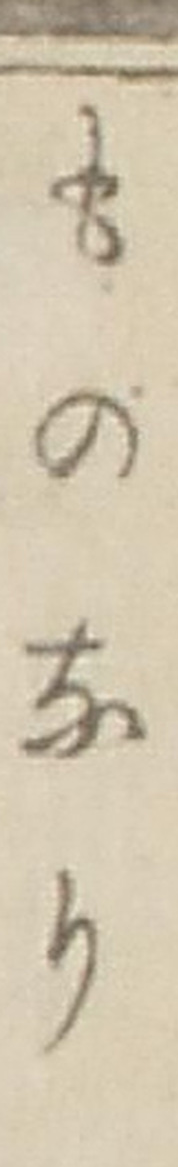ものなり
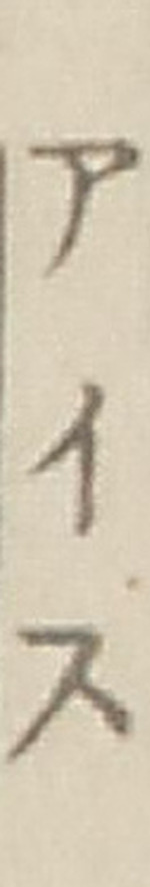アイス
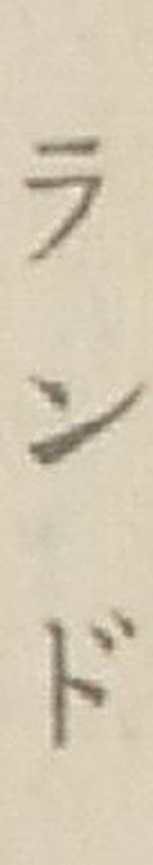ランド
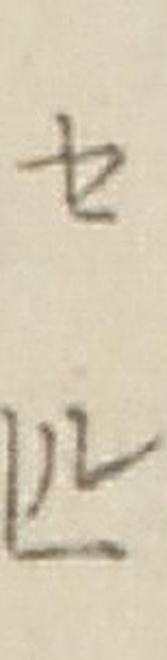セル」
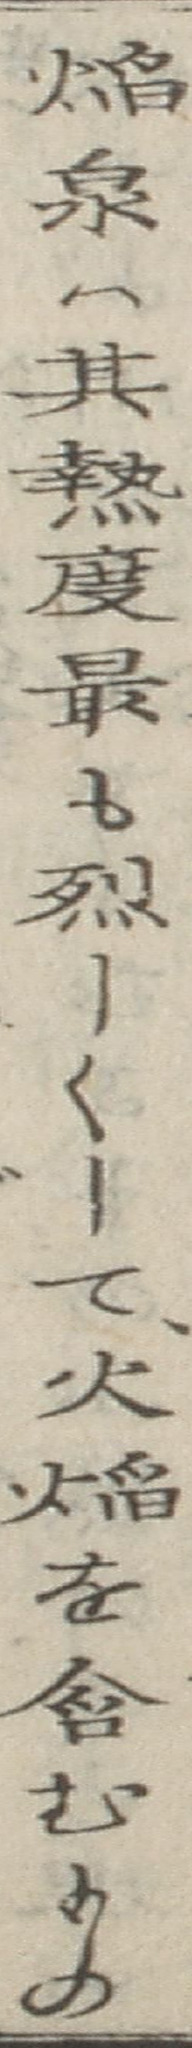焔泉はその熱度最も烈しくして、火焔を含むもの
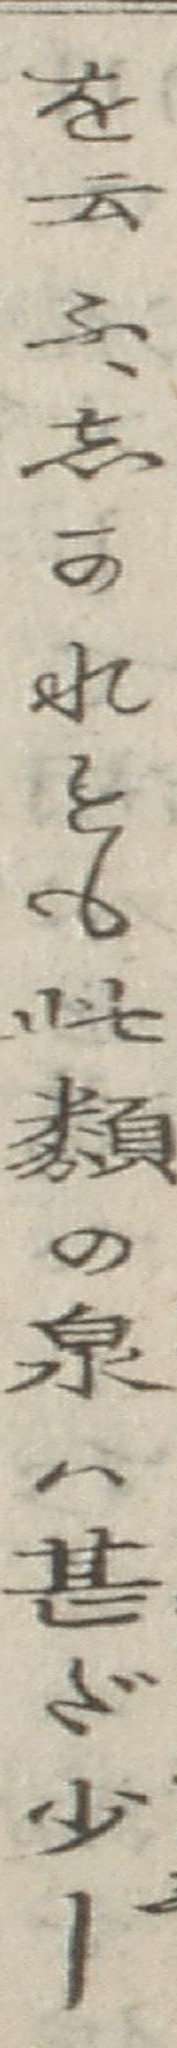を云ふ、しかれとも此類の泉は甚だ少し
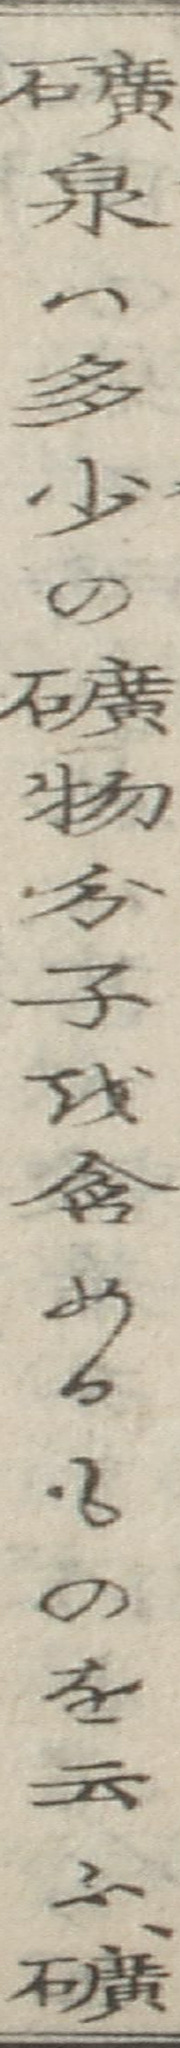礦泉は多少の礦物分子を含めるものを云ふ、礦
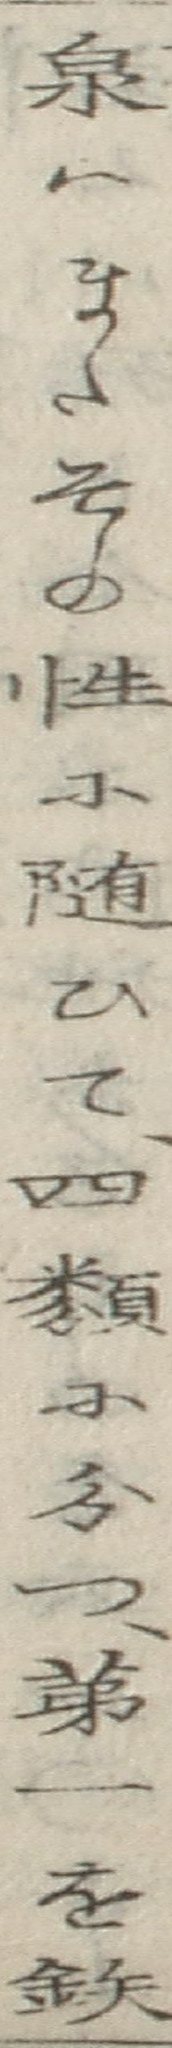泉はまたその性に随ひて、四類に分つ、第一を鉄
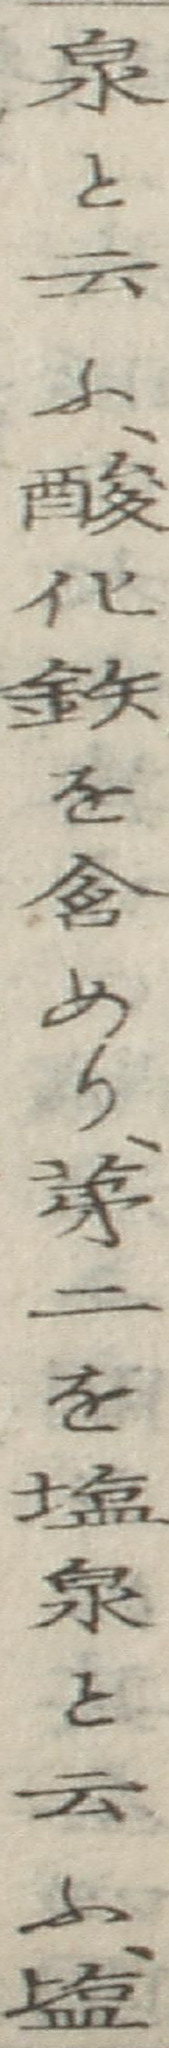泉と云ふ、酸化鉄を含めり、第二を塩泉と云ふ、塩
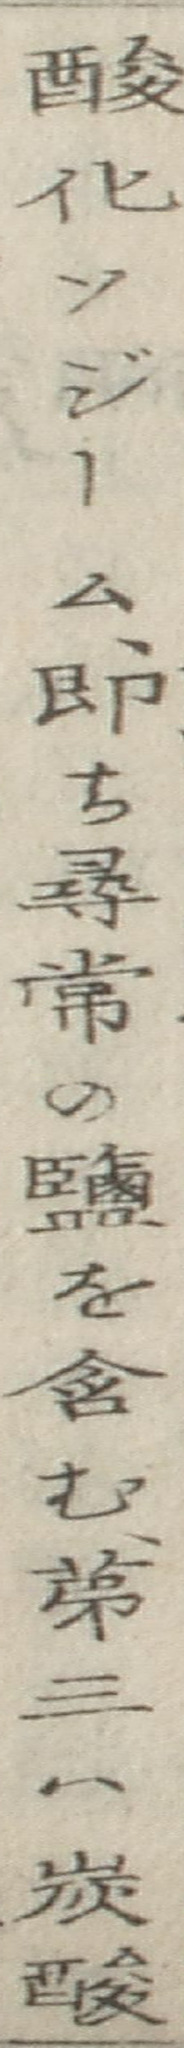酸化ソジーム、即ち尋常の鹽を含む、第三は炭酸
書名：訓蒙　天然地理學　中
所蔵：東京大学地震研究所図書室 Earthquake Research Institute Library, The University of Tokyo, JAPAN
